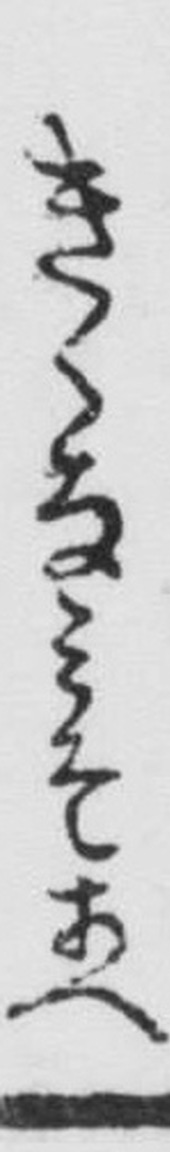きくなみそあへ
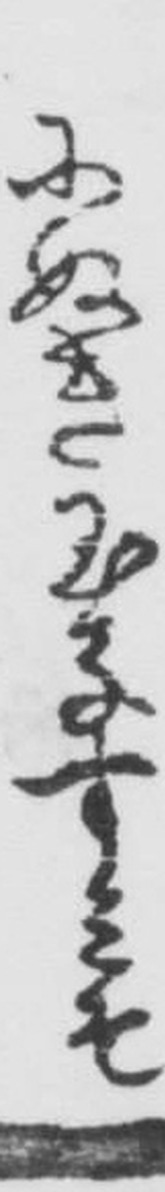にぬき玉子すみそ
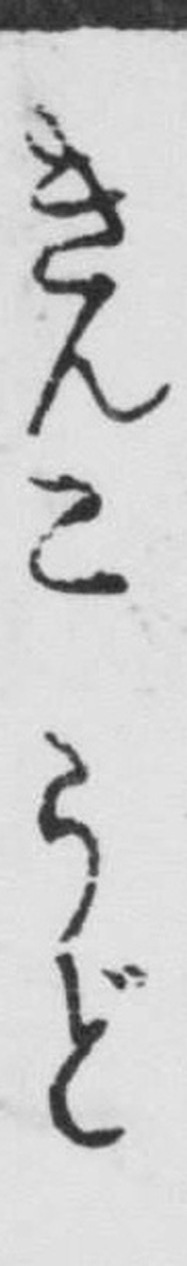きんこうど
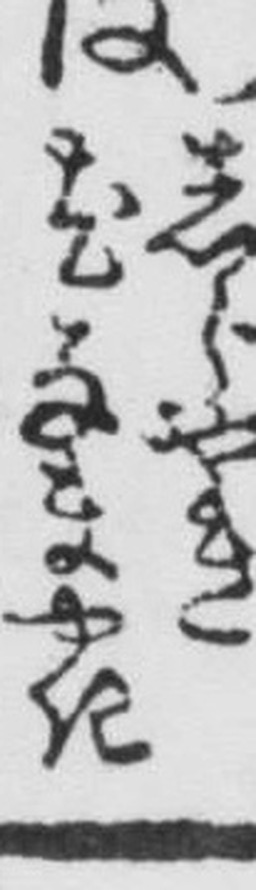尤なまやき
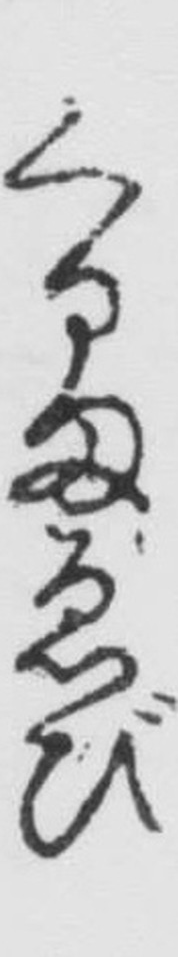くるまゑび
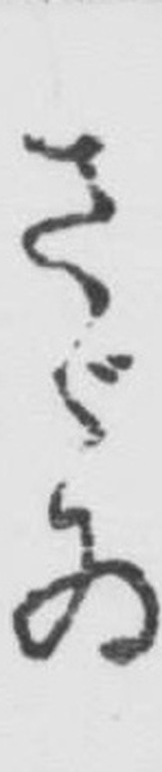さゞゐ
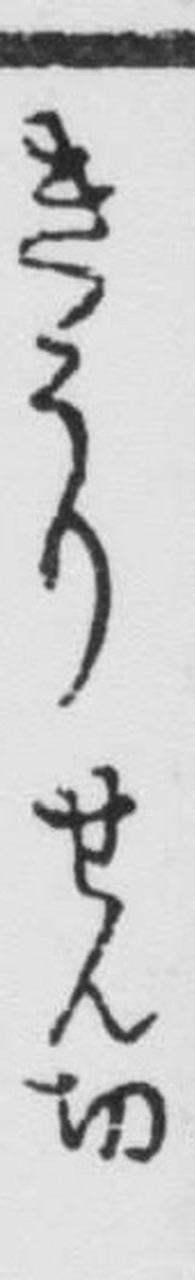きうりせん切
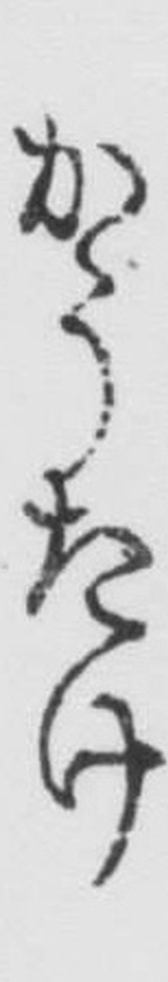かうたけ
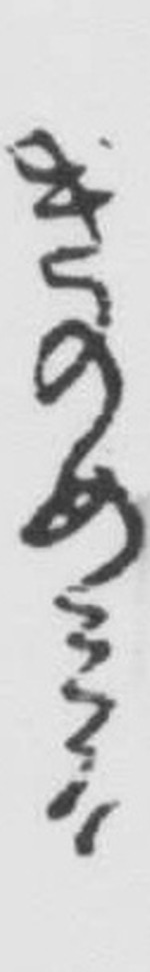きのめみそ
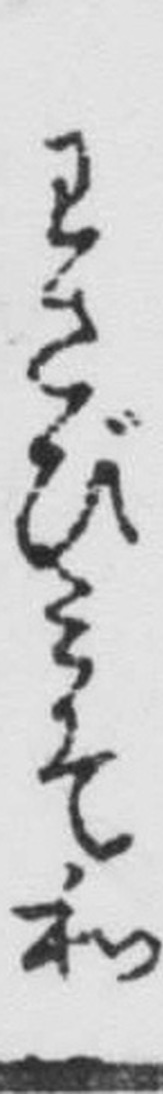わさびみそ和
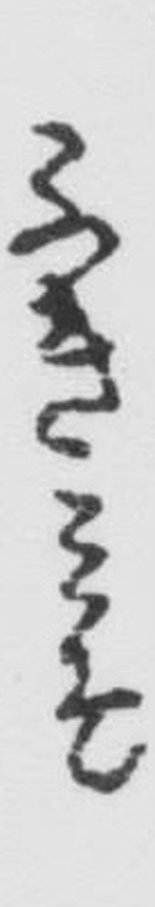ふきみそ
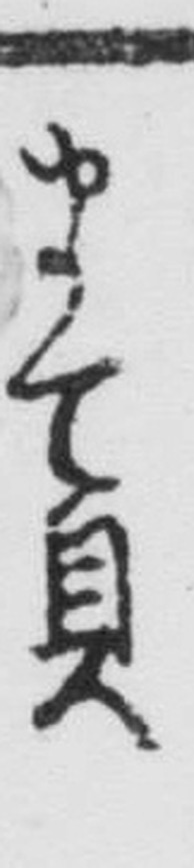まて貝
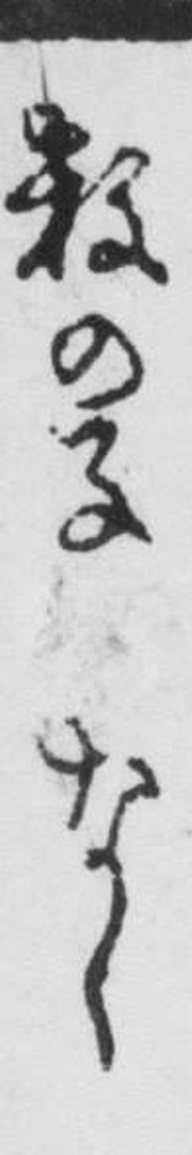数の子なし
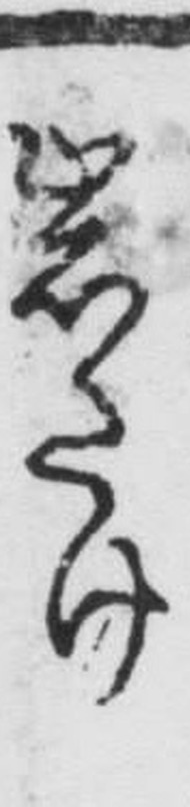岩たけ
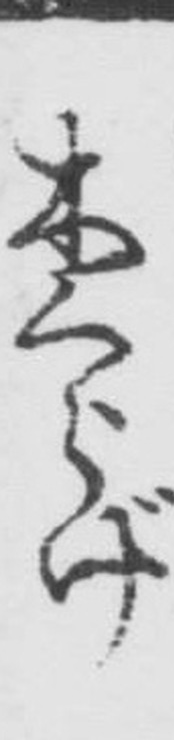木くらげ
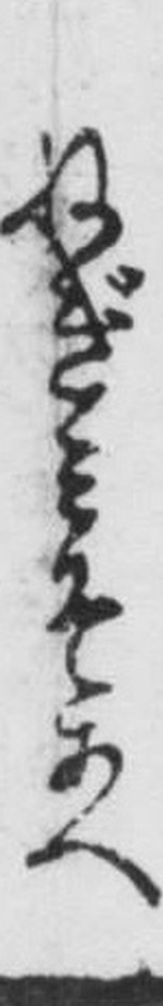ねぎみそあへ
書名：諸家通用/即席料理
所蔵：大阪府立大学学術情報センター 国文学研究資料館
